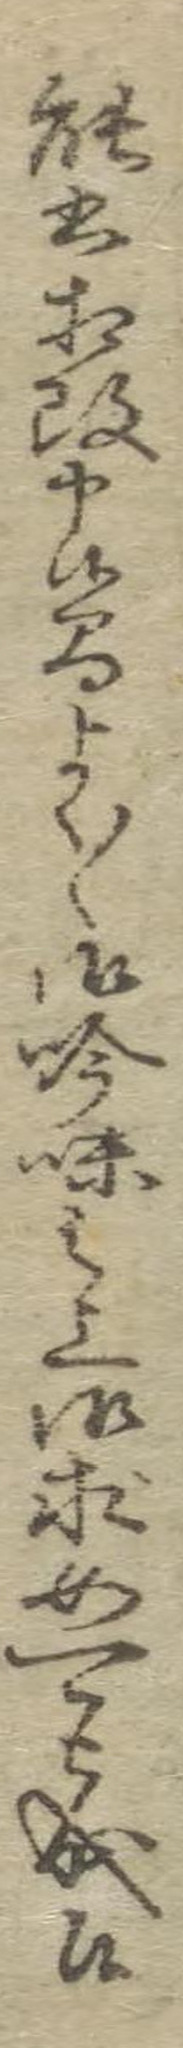能書相改申候間よく〳〵御吟味之上御求め可被成候
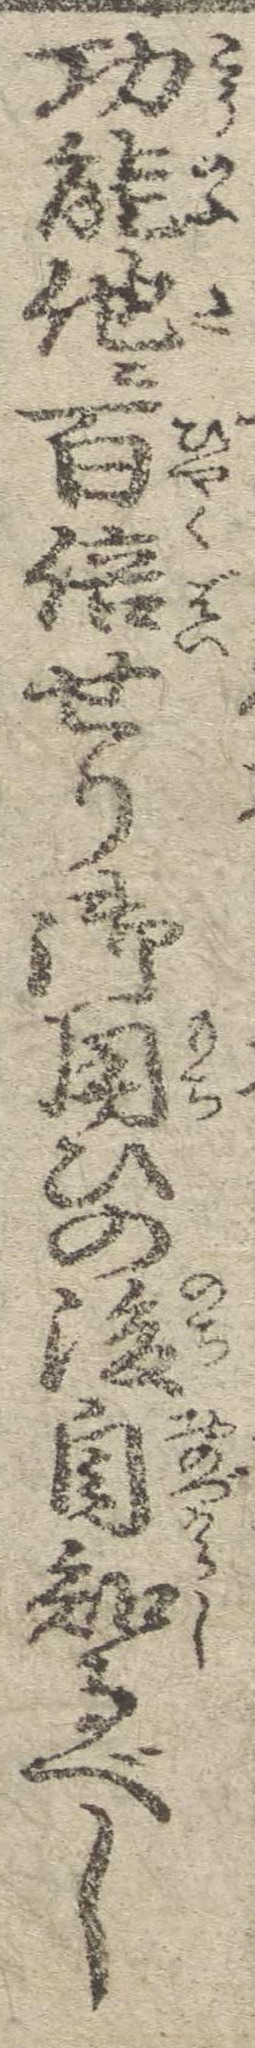功能他百倍せり御用ひの後自知るべし
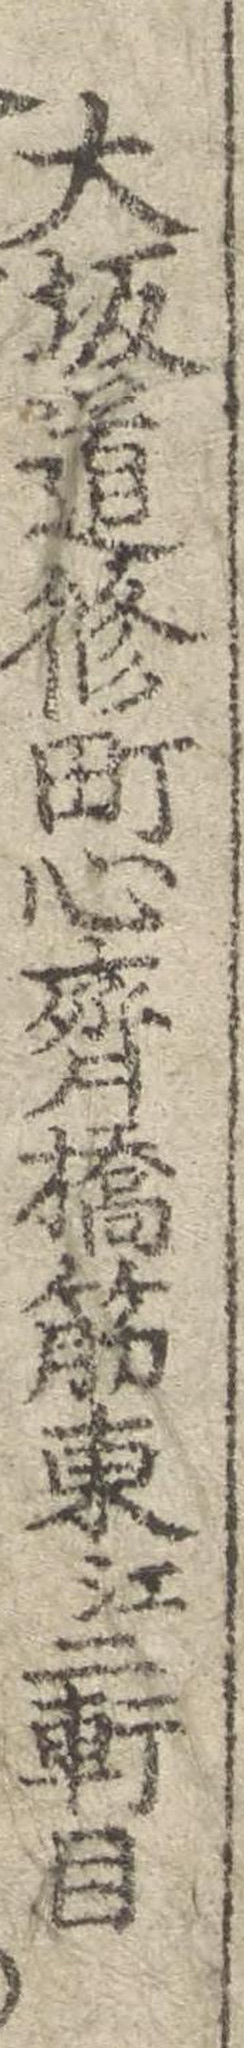大坂道修町心齊橋筋東江二軒目
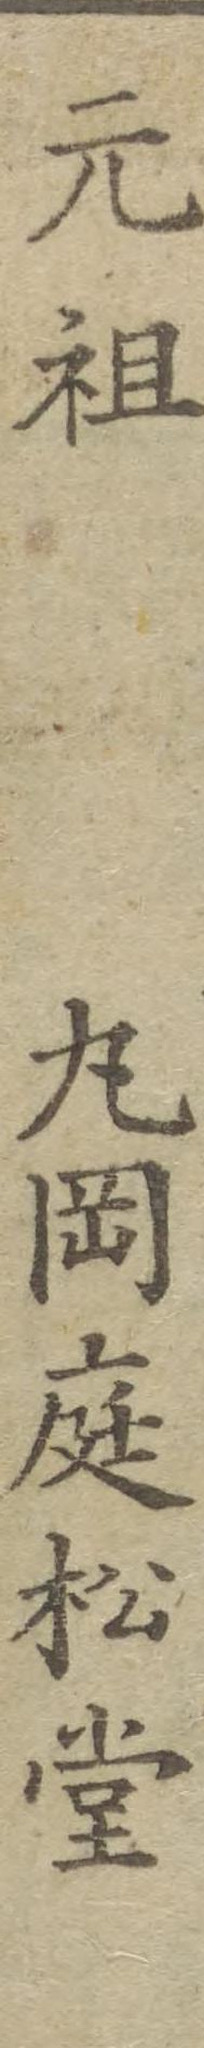元祖丸岡庭松堂
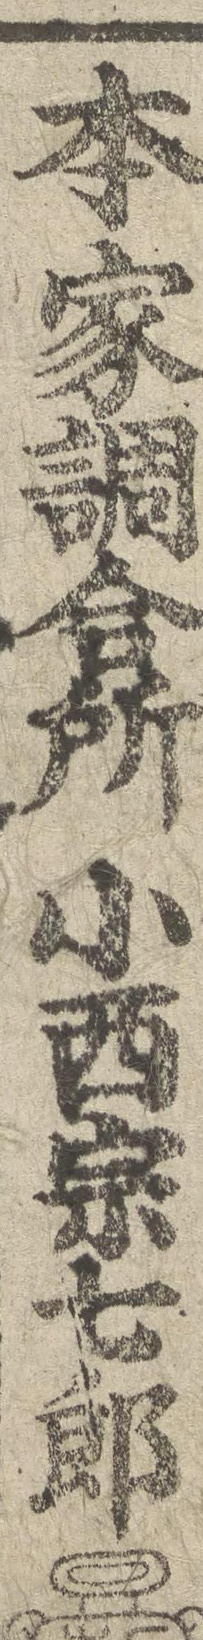本家調合所小西宗七郎
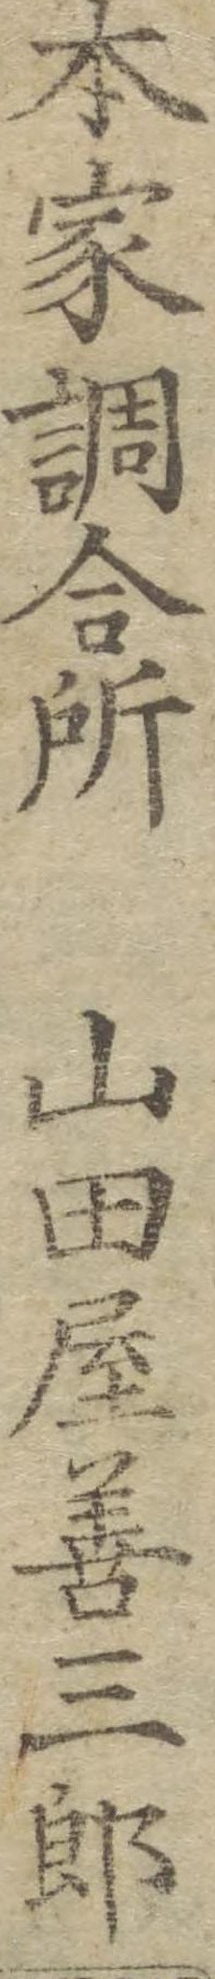本家調合所山田屋善三郎
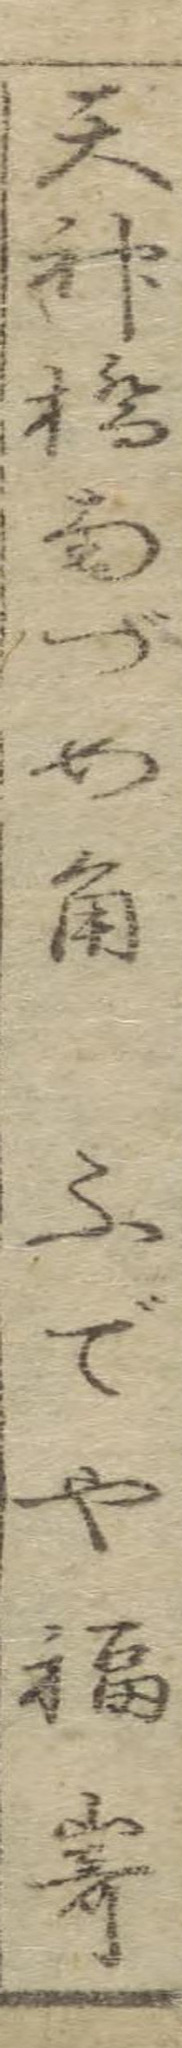天神橋南づめ角ふでや福崎
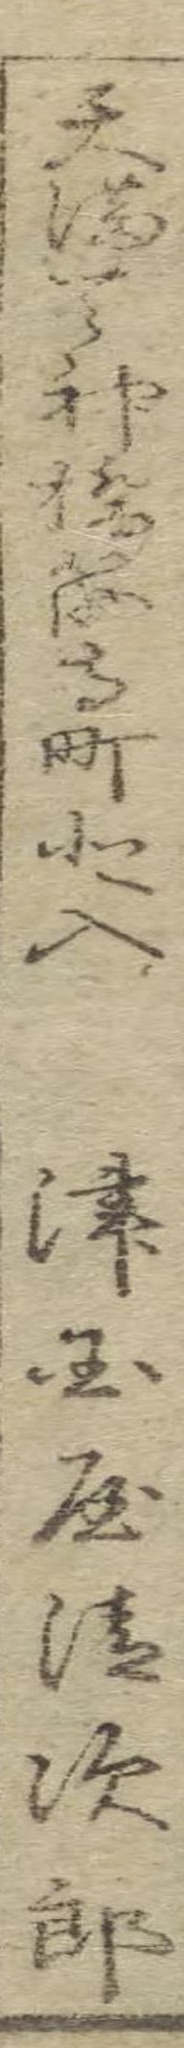天満天神橋筋寺町北へ入津国屋清次郎
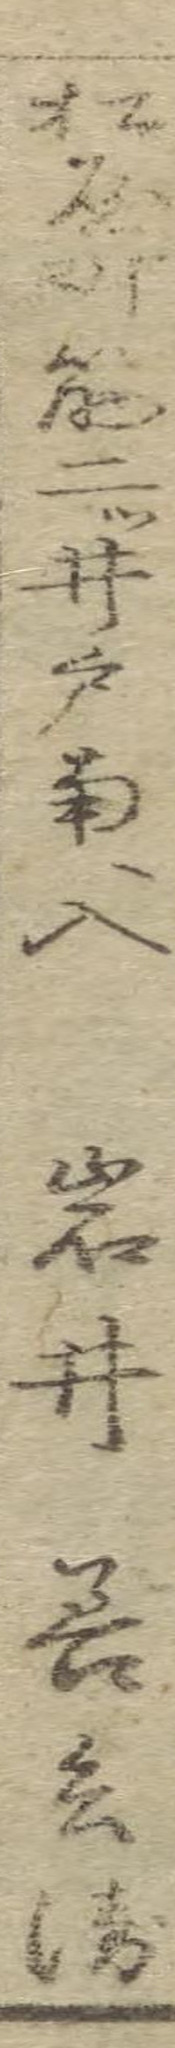松屋町筋二ッ井戸南へ入岩井善兵衛
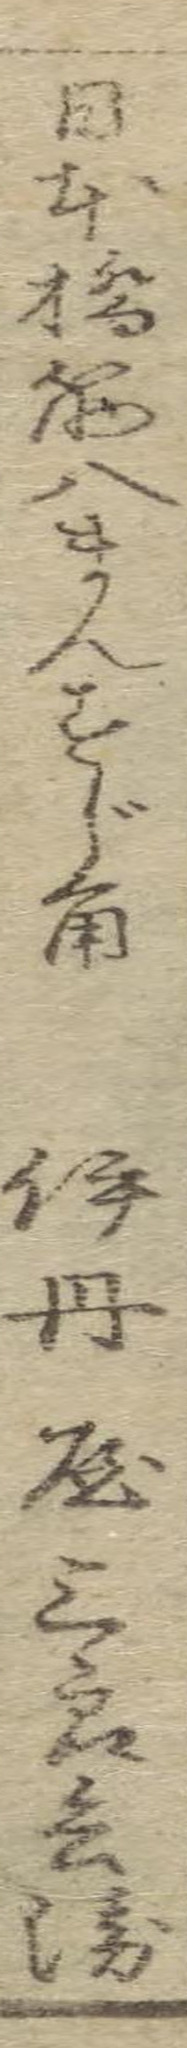日本橋筋八まんすじ角伊丹屋三郎兵衛
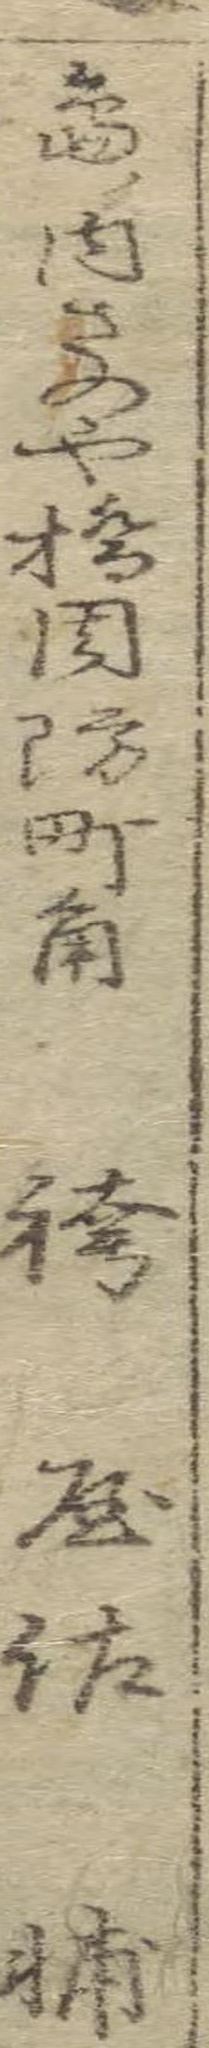嶋ノ内さのや橋周防町角袴屋佐輔
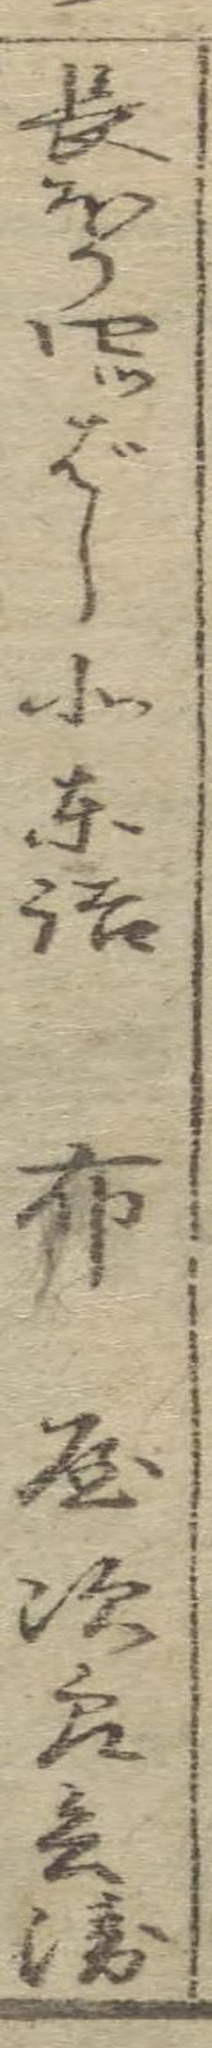長ほり四ッばし北東詰布屋次郎兵衛
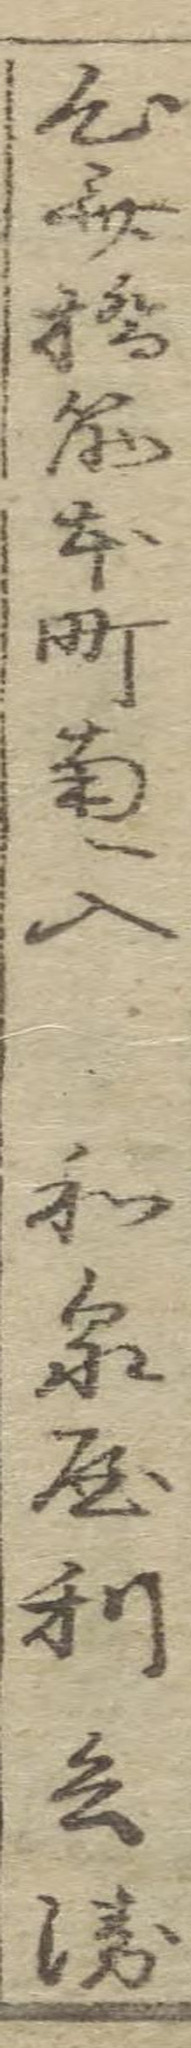心斎橋筋本町南へ入和泉屋利兵衛
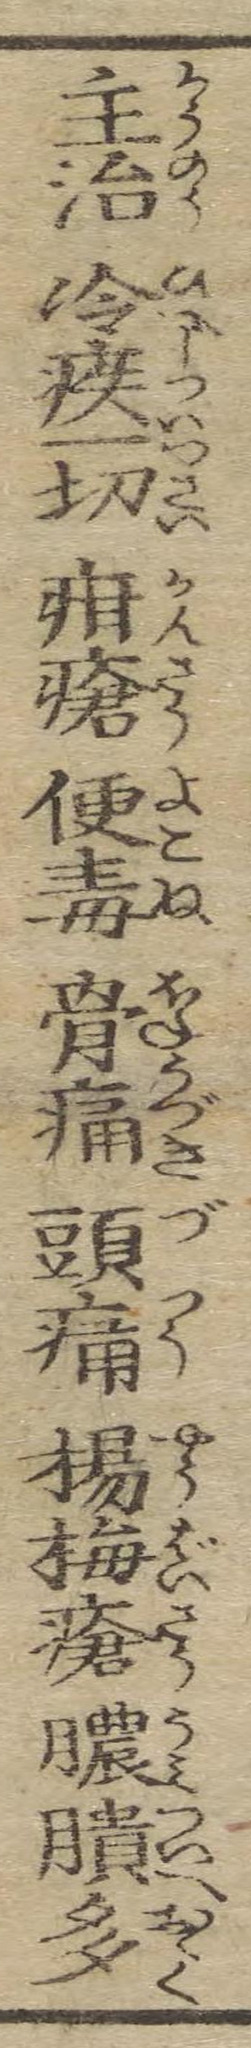主治冷疾一切疳瘡便毒骨痛頭痛楊梅瘡膿潰多
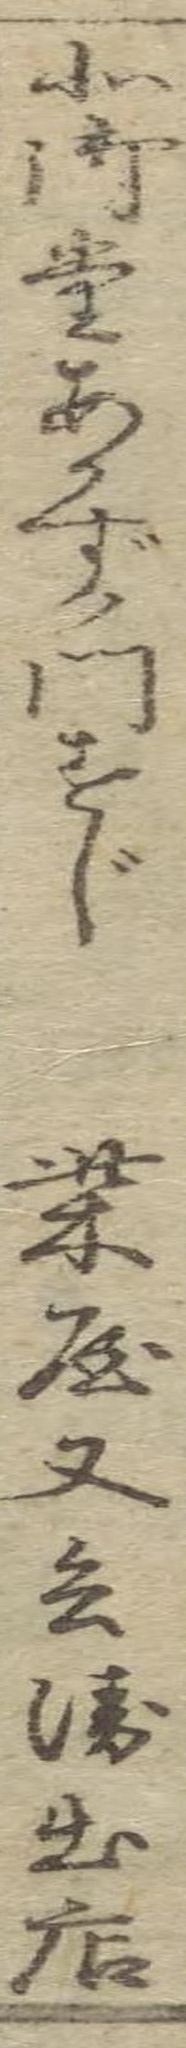北御堂あかずか門すじ柴屋又兵衛出店
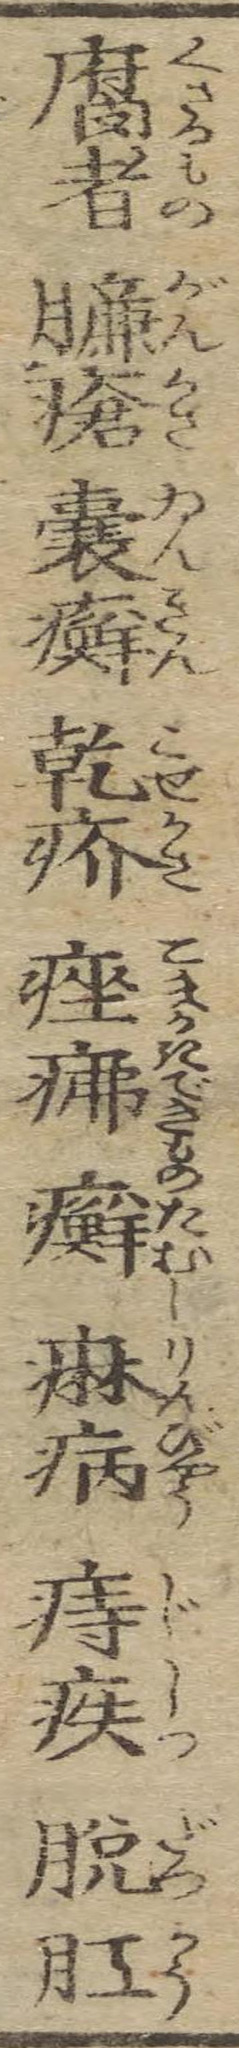腐者膁瘡嚢癬乾疥痤疿癬痳病痔疾脱肛
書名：浪華薬種問屋能書張交帖. 二
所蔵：国立国会図書館 National Diet Library, JAPAN
